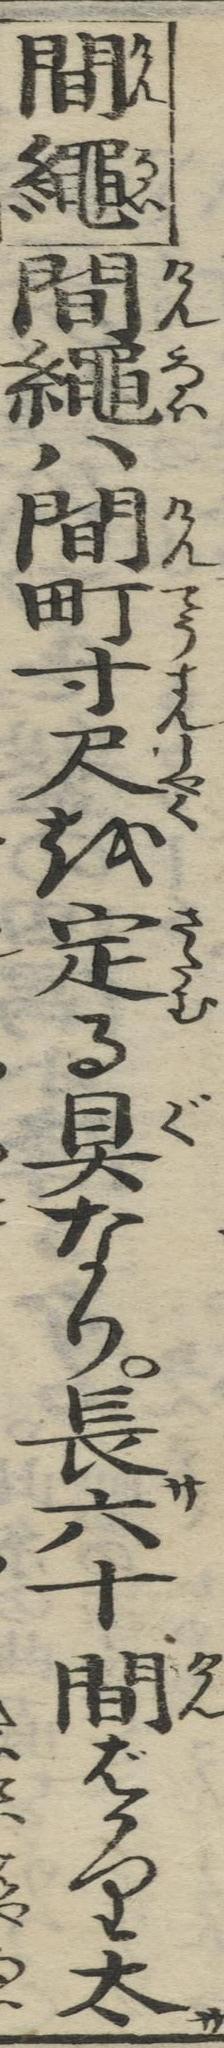間縄間縄は間町寸尺を定る具なり。長さ六十間ばかり太さ
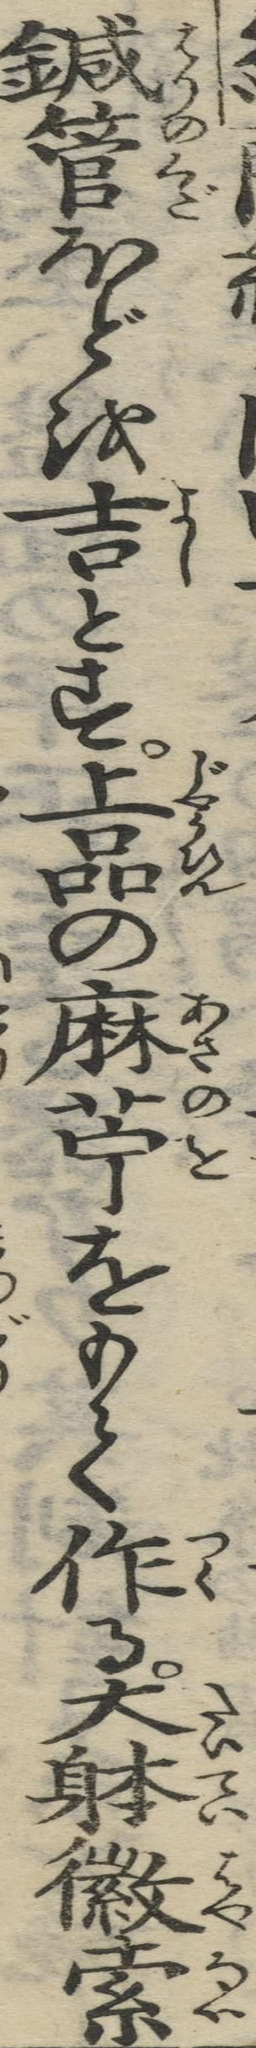鍼管ほどを吉とす。上品の麻苧をもて作る。大躰微？索
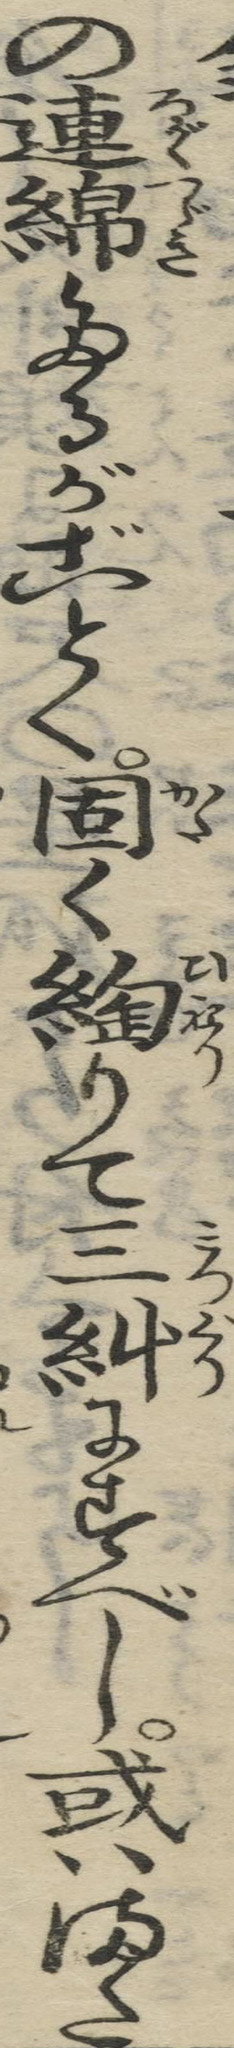の連綿たるがごとく。固くりて三糾にすべし。或はまた
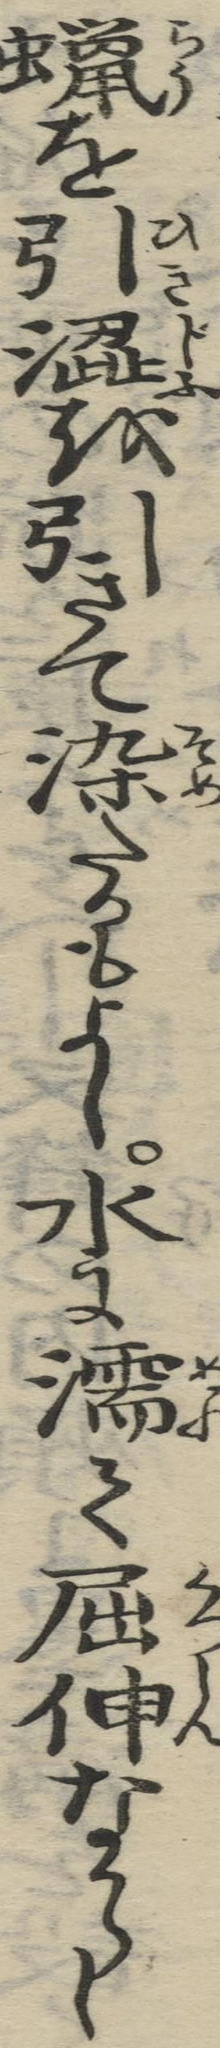蝋を引渋を引きて染たるもよし。水に濡て屈伸なからし
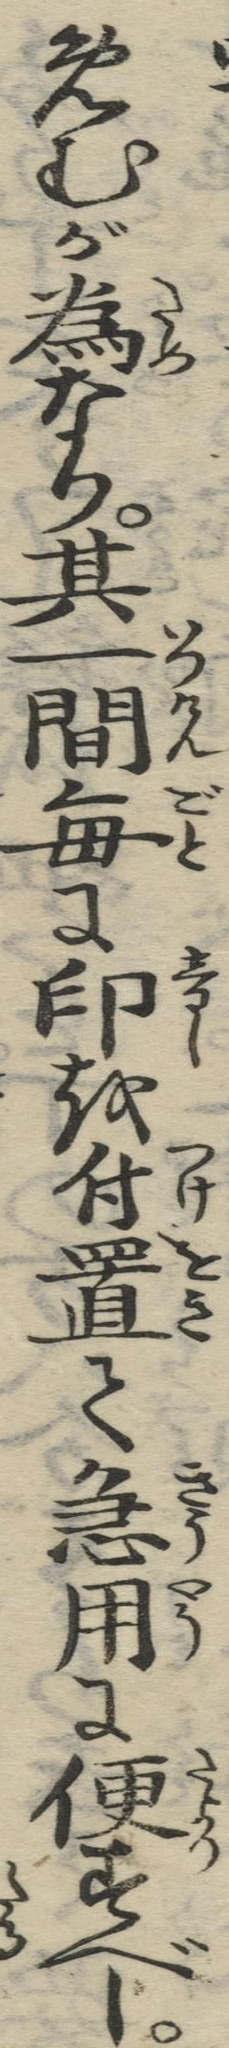めむが為なり。其一間毎に印を付置て急用に便すべし。
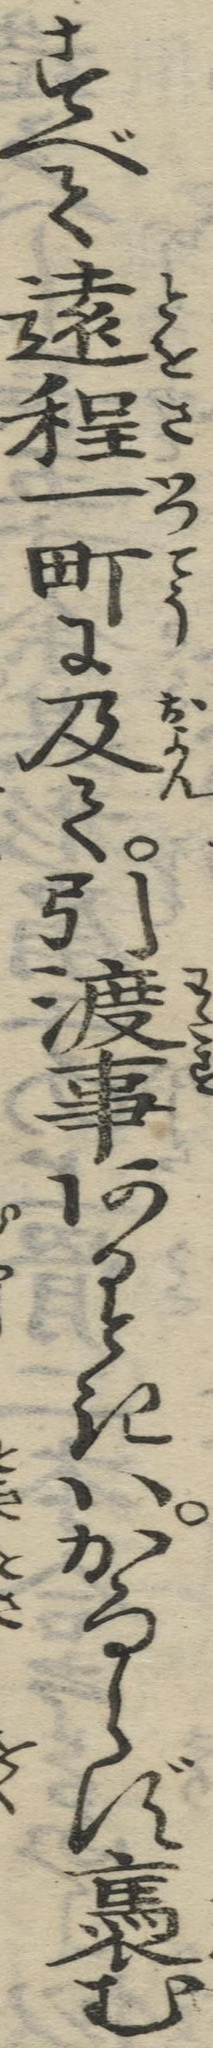すべて遠程一町に及て。引渡事あるときは。かならず垂？む
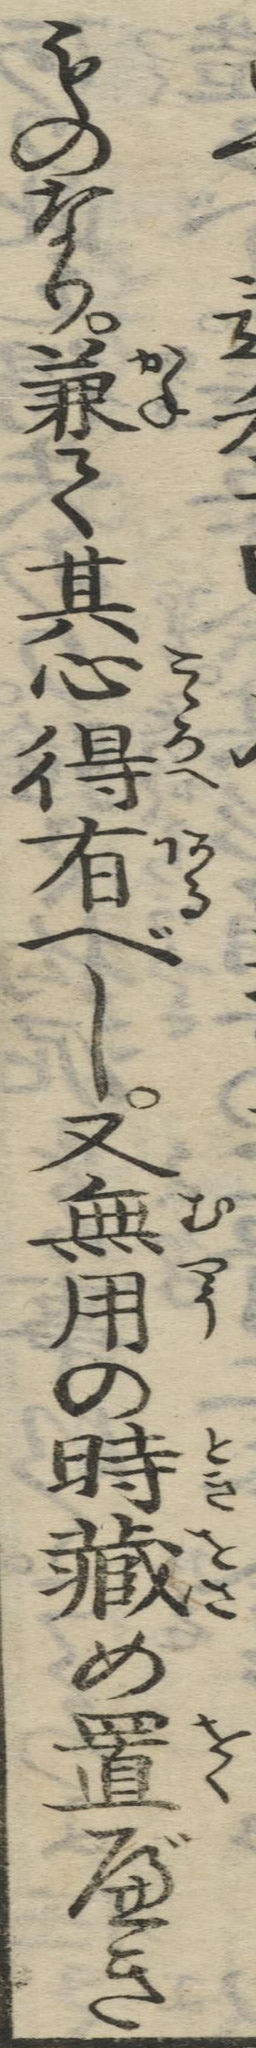ものなり。兼て其心得有べし。又無用の時蔵め置べき
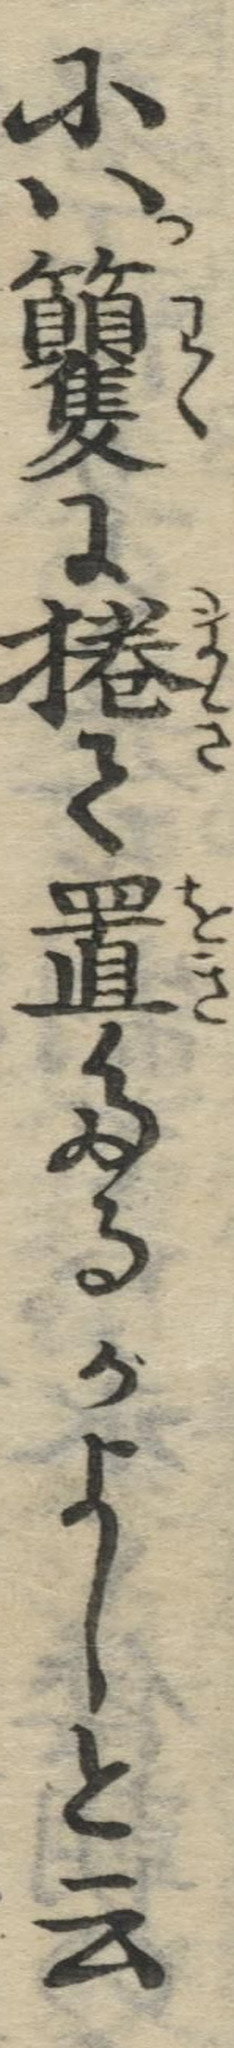には。篗に捲て置たるがよしと云
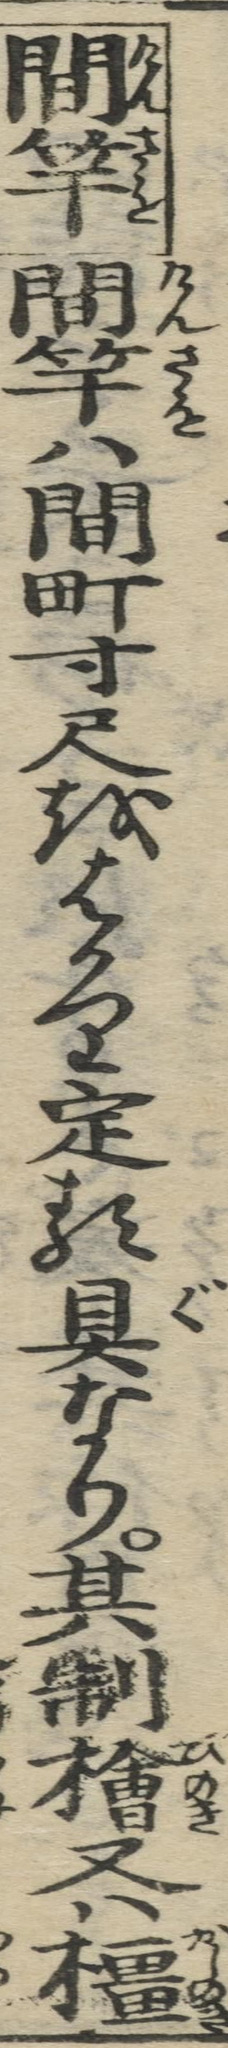間竿間竿は間町寸尺をはかり定る具なり。其制桧又は橿
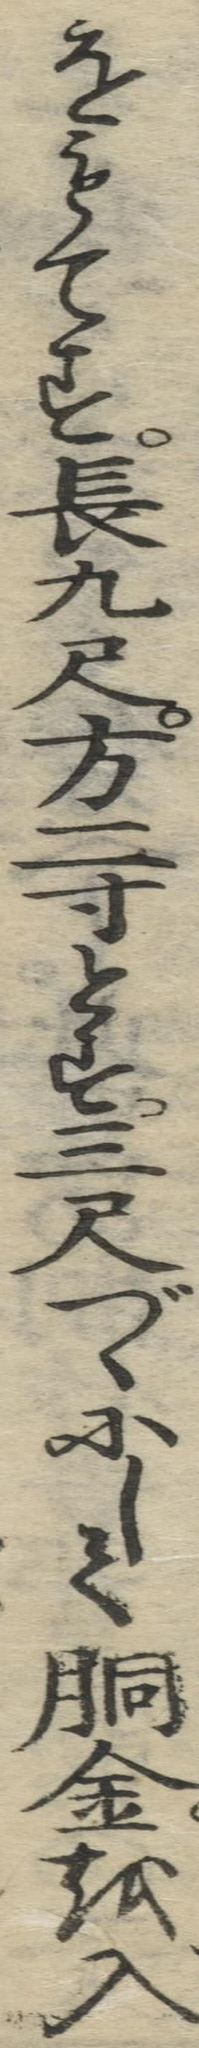をもてす。長九尺。方二寸とす。三尺づゝにして胴金を入
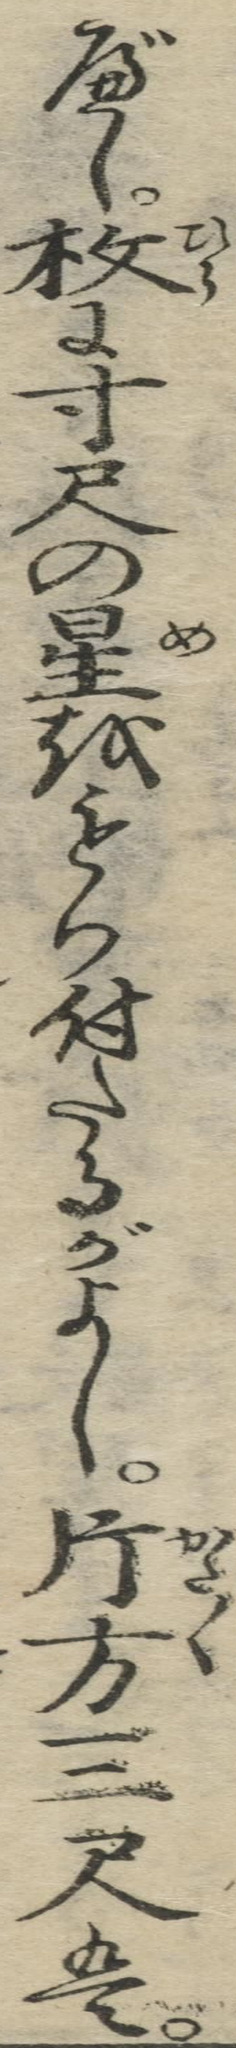べし。枚に寸尺の星をもり付たるがよし。片方三尺もて。
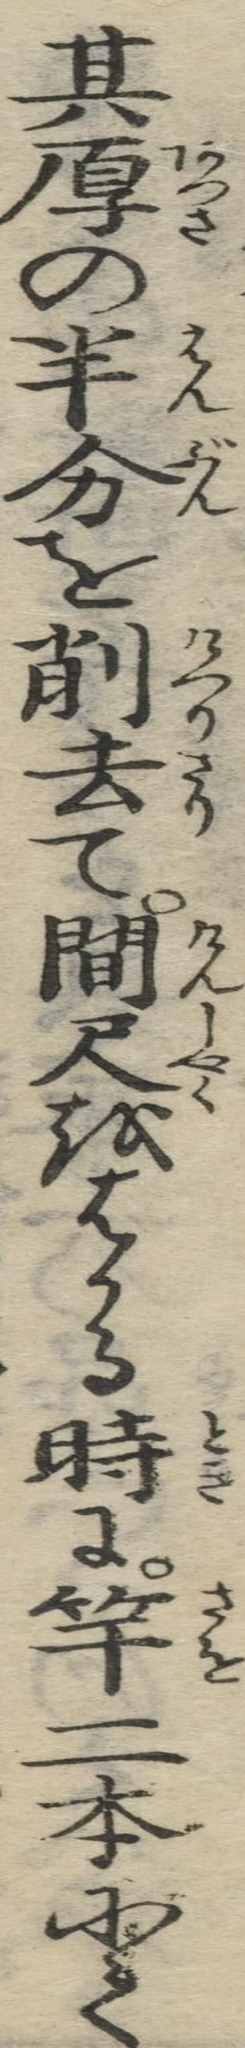其厚の半分を削去て。間尺をはかる時に。竿二本にて
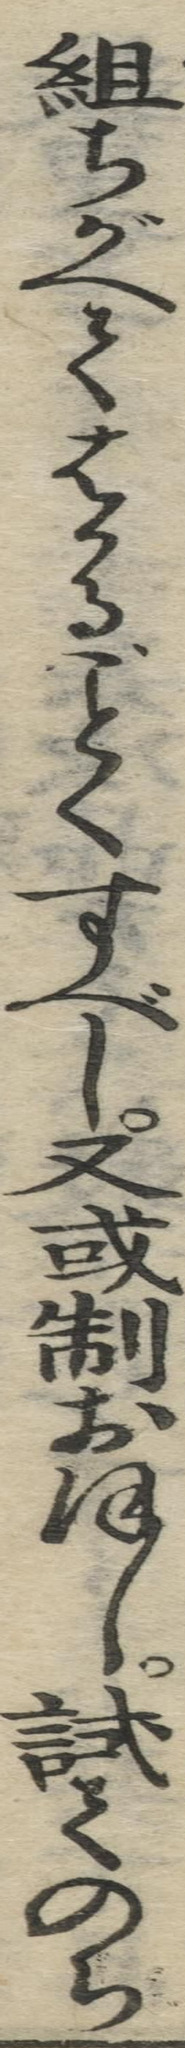組ちがへてはかるごとくすべし。又或制おほし。試てのち
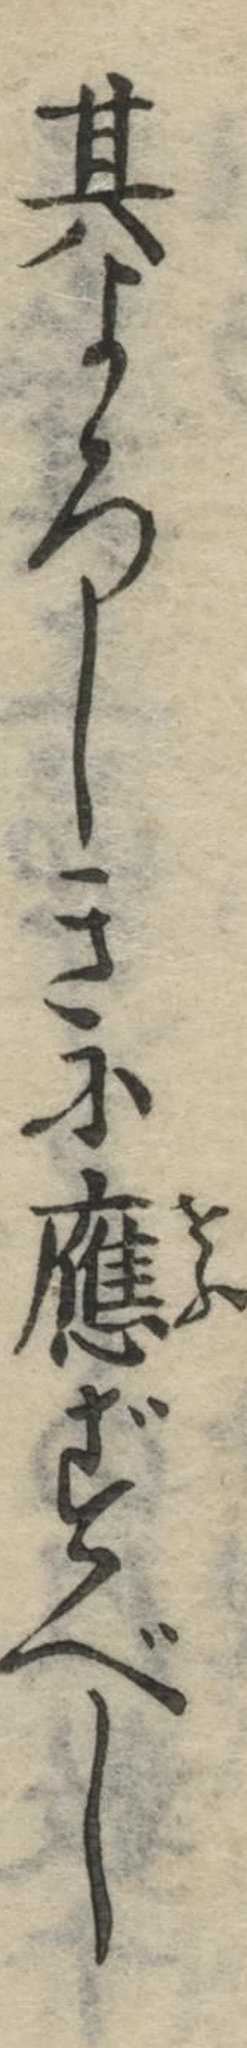其よろしきに応ずべし
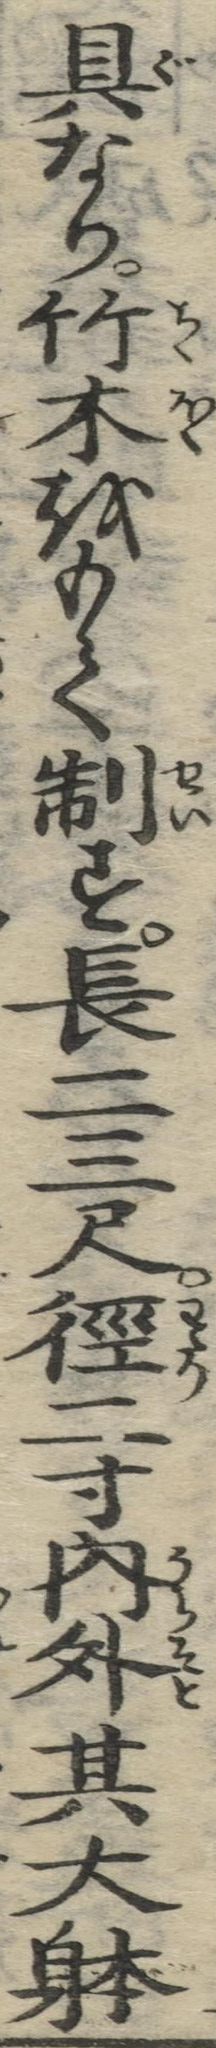具なり。竹木をもて制す。長二三尺。径二寸内外其大躰
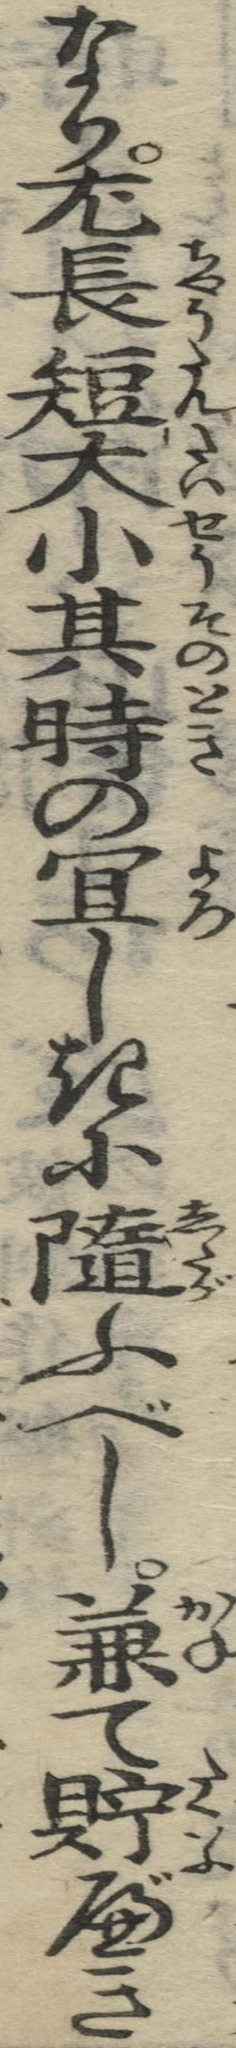なり。尤長短大小其時の宜しきに随ふべし。兼て貯べき
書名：量地指南　巻之一（内題）
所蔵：東京大学地震研究所図書室 Earthquake Research Institute Library, The University of Tokyo, JAPAN
